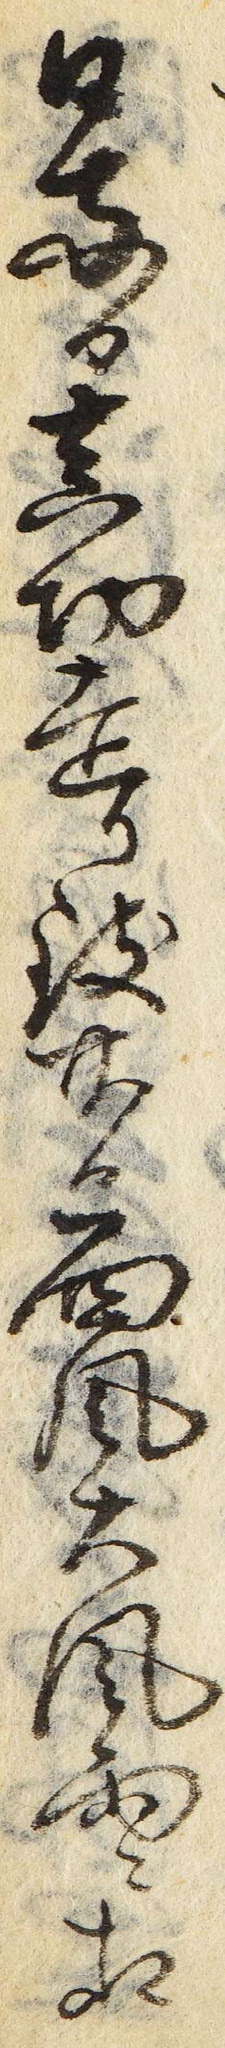日両日真切走り致廿日西風大風雨ニ相

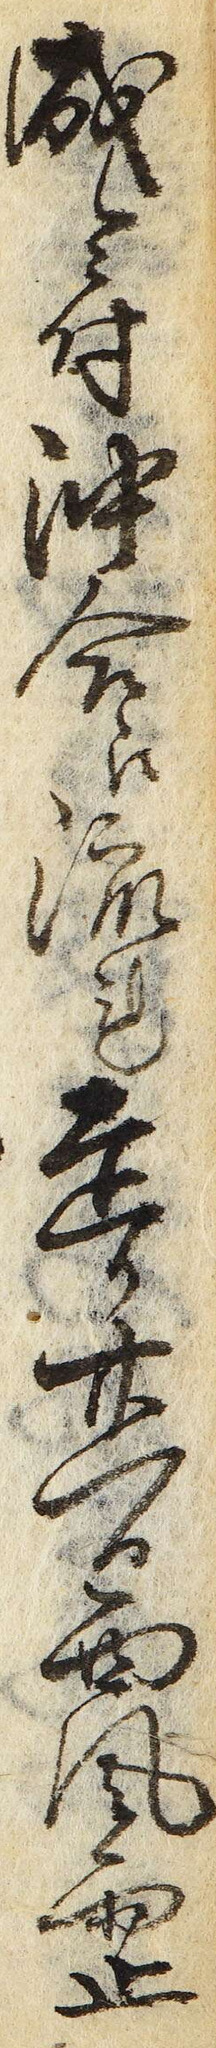成候ニ付沖合え流れ走り廿一日西風雨止
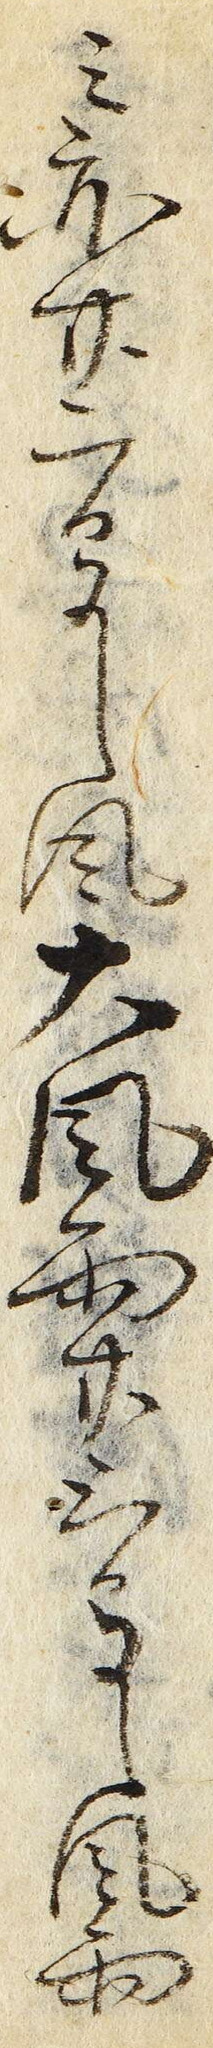ミ亦廿ニ日にし風大風雨廿三日にし風雨
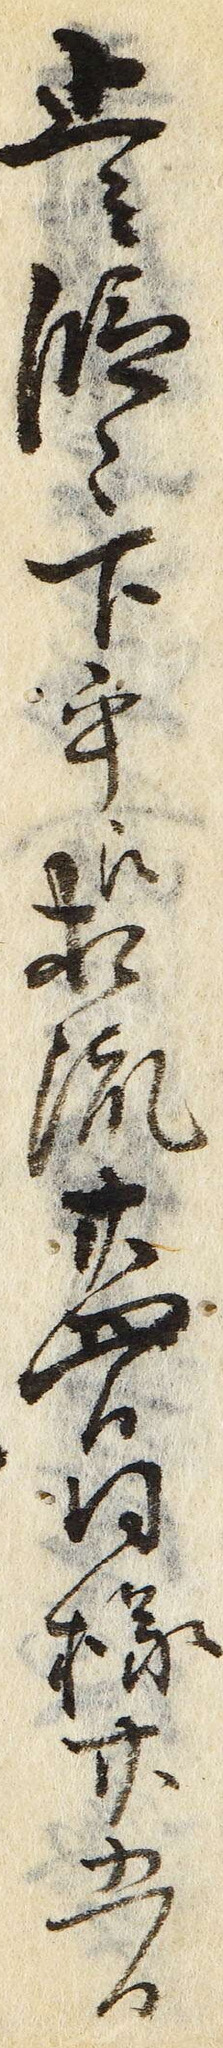止ミ段々下手え相流廿四日同様廿五日
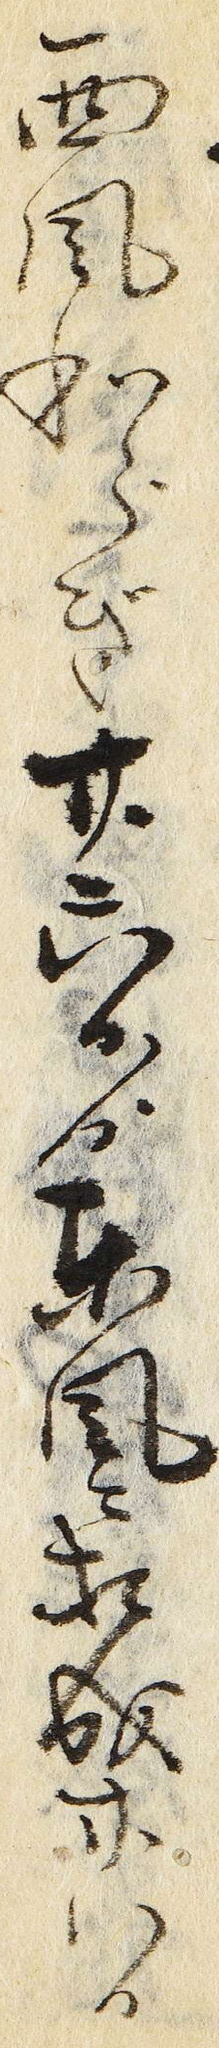西風和らぎ廿六日ゟ東風ニ相成廿八日
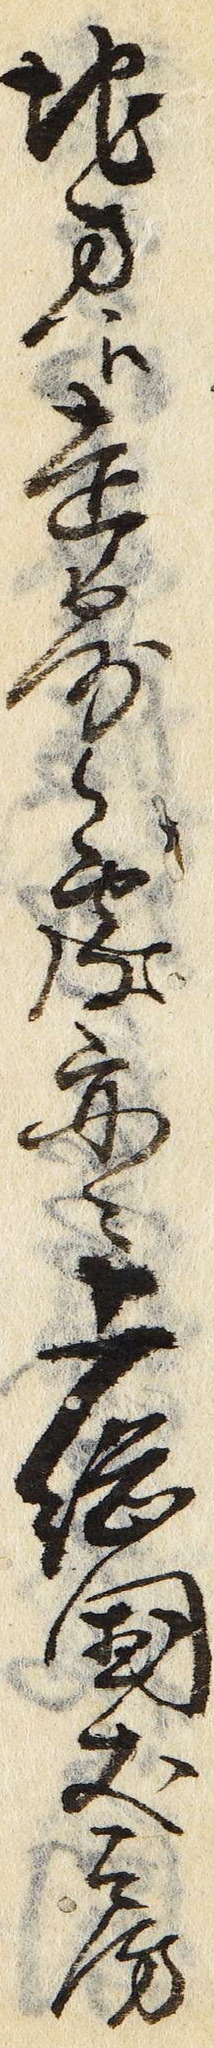地方え走寄候処亦々上総国犬房
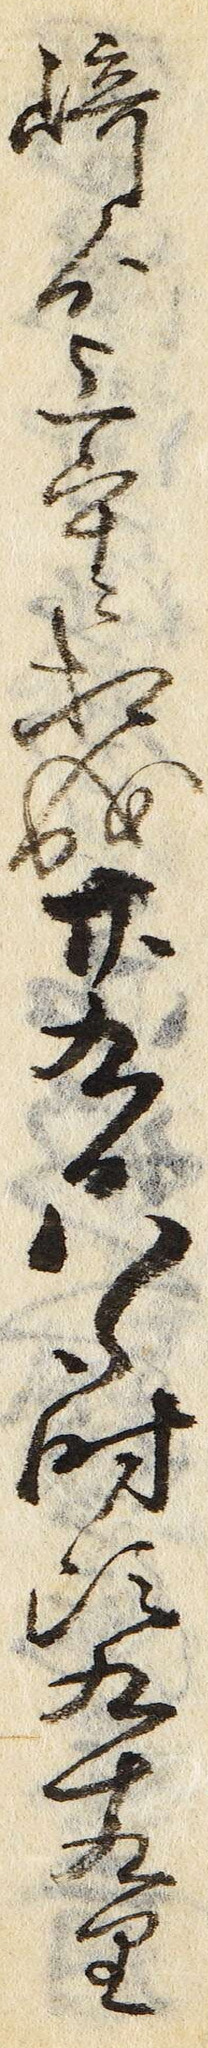崎ゟ上手ニ相成廿九日八ツ時頃九十九里
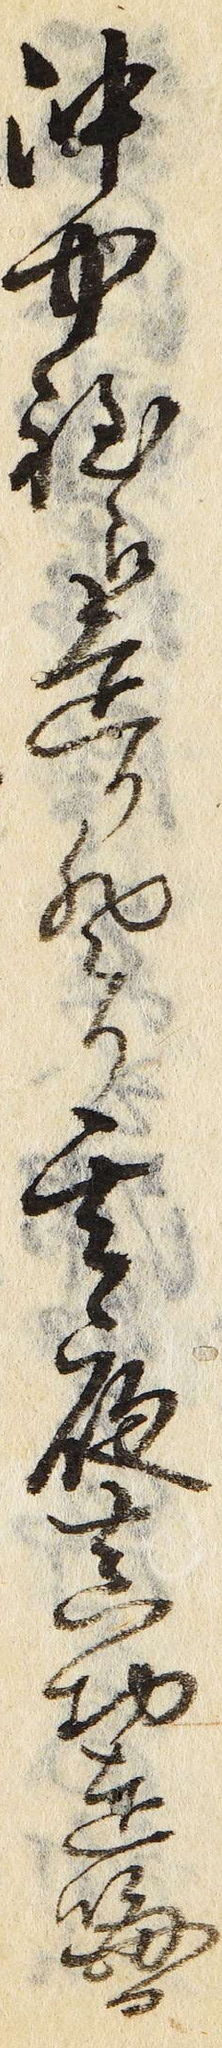沖中程え走り登り其夜真切走晦日
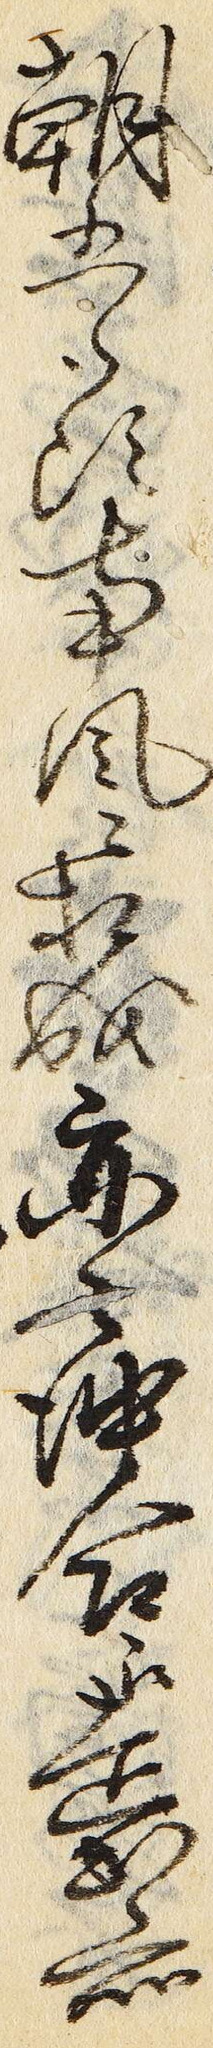朝五ツ頃南風ニ相成亦々沖合え走出候所
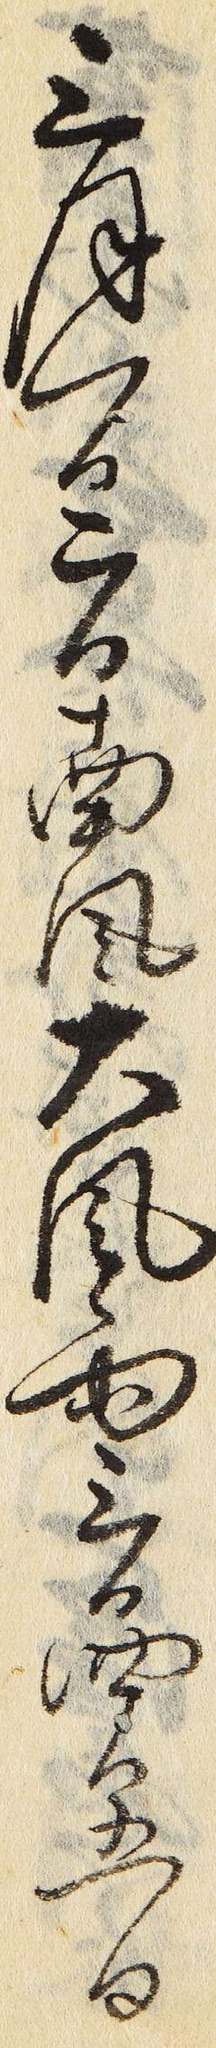三月一日二日南風大風雨三日四日五日
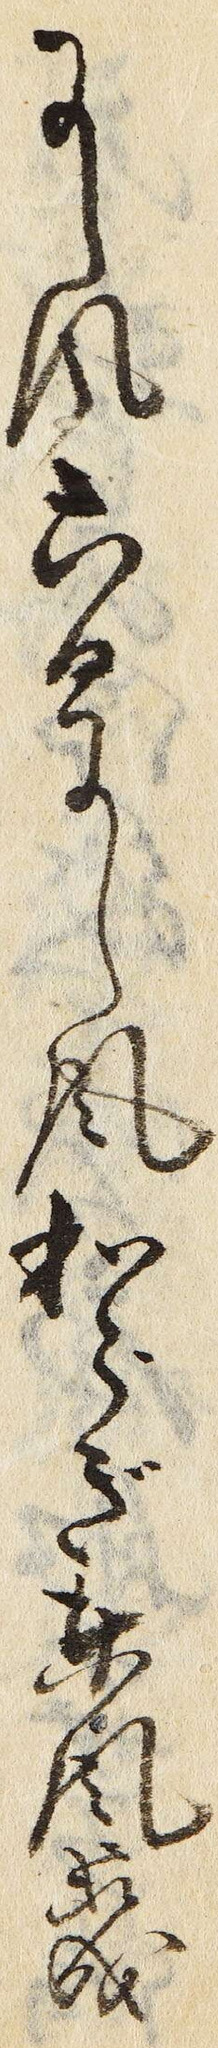にし風六日にし風和らぎ東風ニ相成
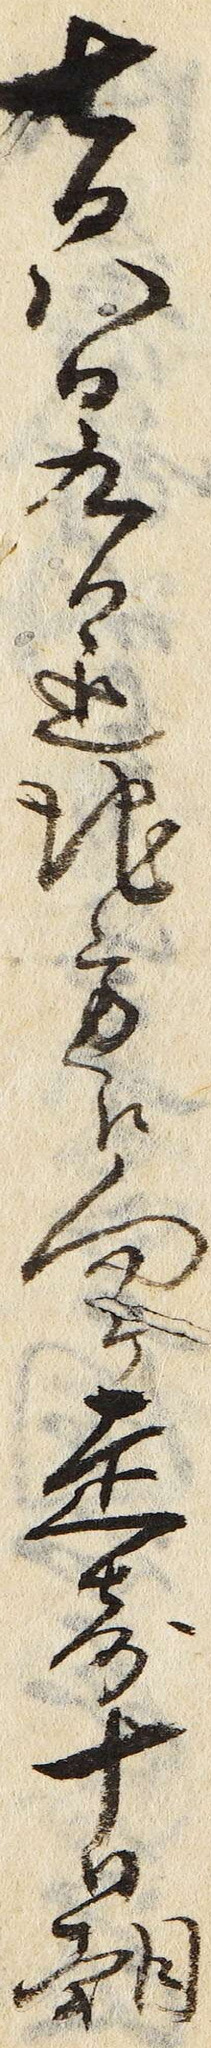七日八日九日迄地方え向ケ走寄十日朝
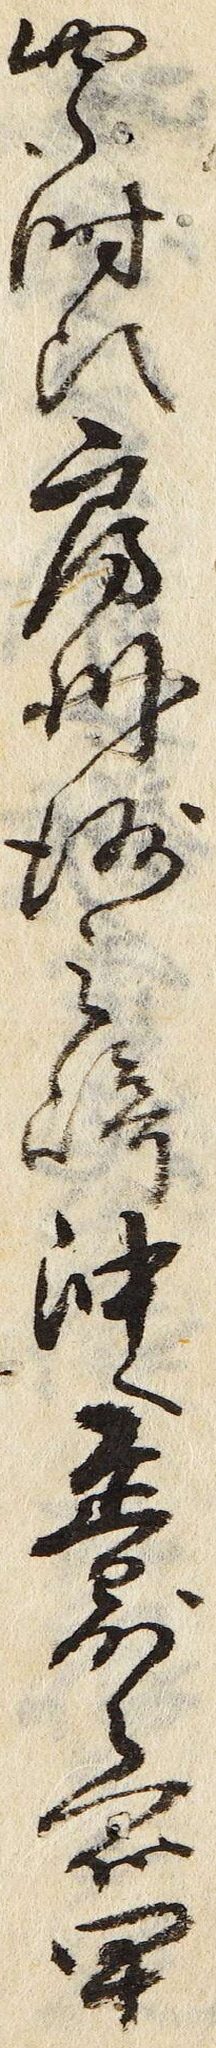四ツ時頃房州洲之崎沖へ走寄候所早
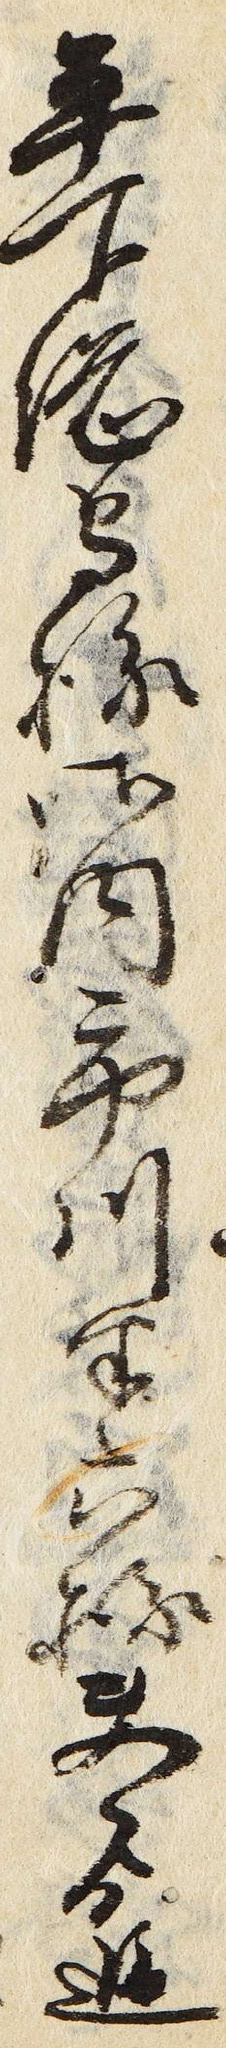平下総守様御内市川半六様夫ゟ追
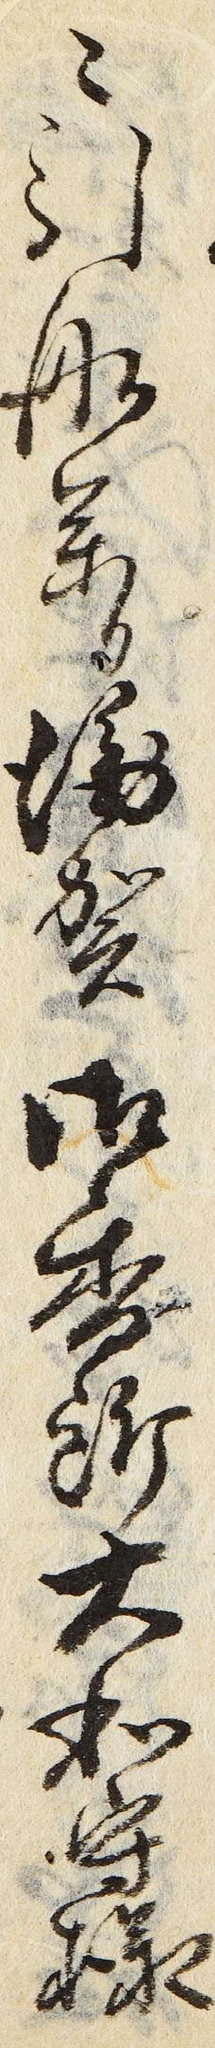々引船参り浦賀御番所大和守様
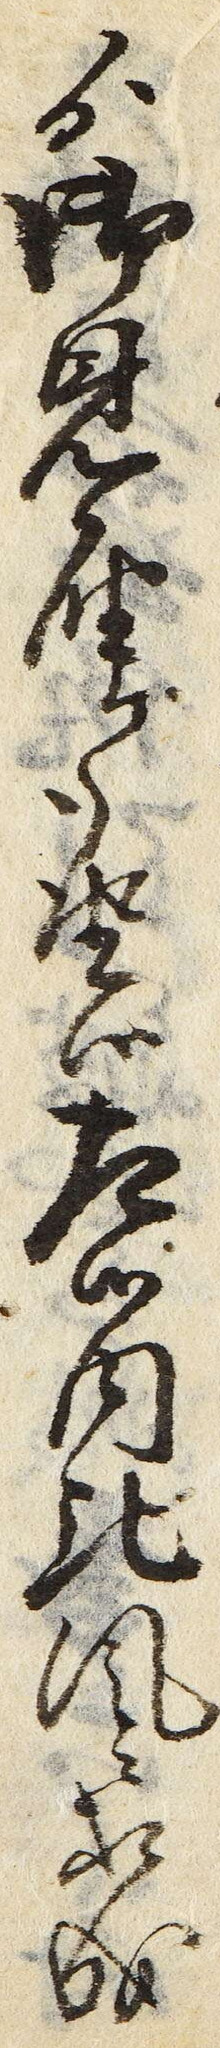ゟ御見届ケ御座候左候内北風ニ相成
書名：阿波幸宝丸漂流記
